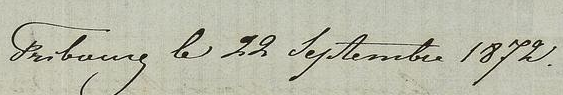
Fribourg le 22 Septembre 1872.
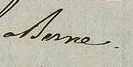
Berne.
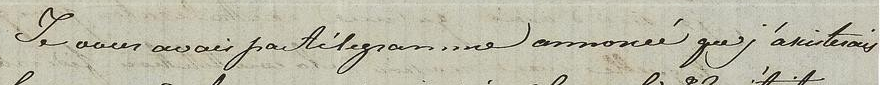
Je vous avais par télegramme annoncée que j'assisterais
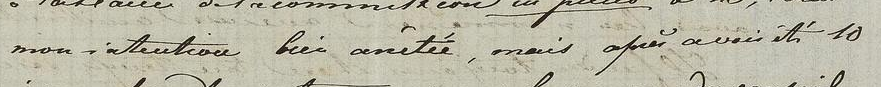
mon intention bien arrêtée, mais après avoir été 10
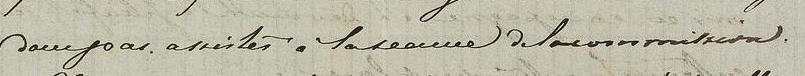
donc pas assister à la seance de la commission.
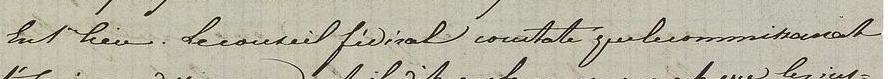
Eut bien. Le conseil fédéral constate que le commissariat
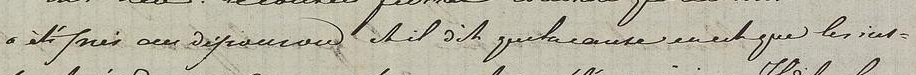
a été pris au dépourvu et il dit que la cause en est que les ins-
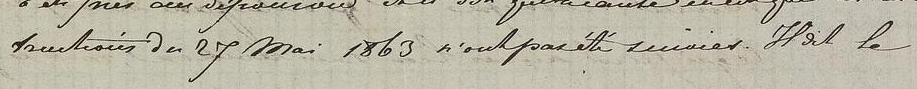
tructions du 27 Mai 1863 n'ont pas été suivies. Il dit
